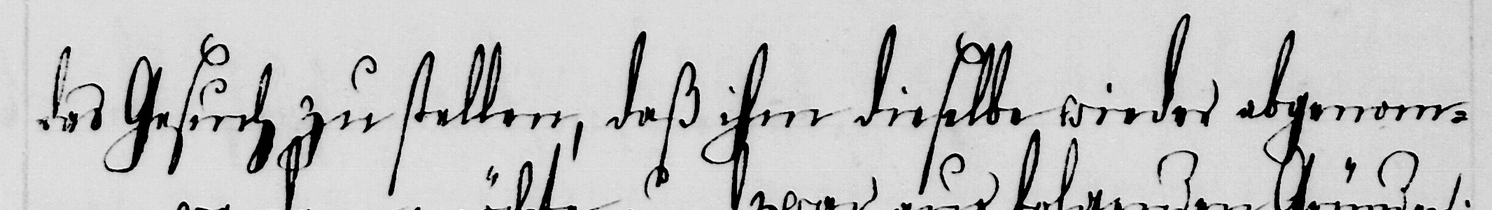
das Gesuch zu stellen, daß ihm dieselbe wieder abgenom¬
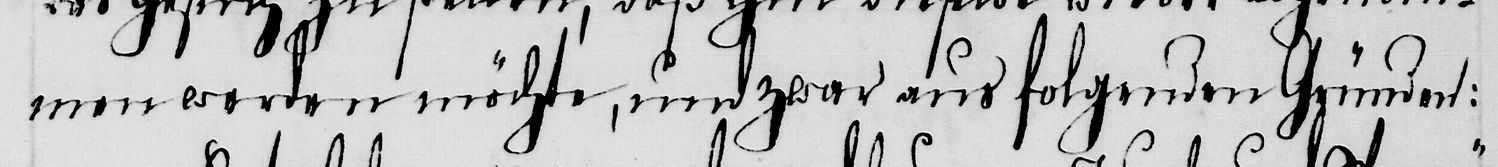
men werden möchte, und zwar aus folgenden Gründen:
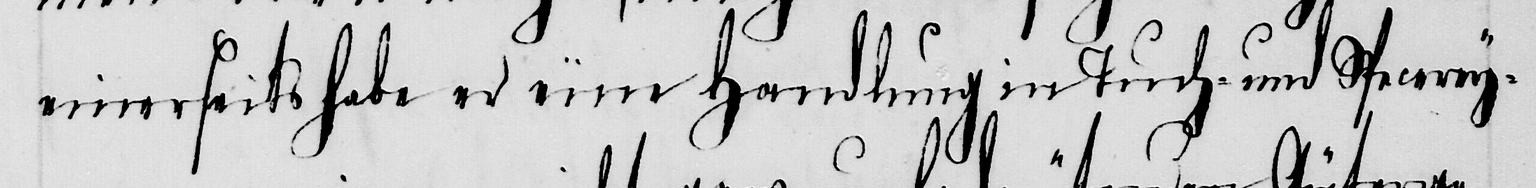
einerseits habe er eine Handlung in Tuch- und Specerey¬
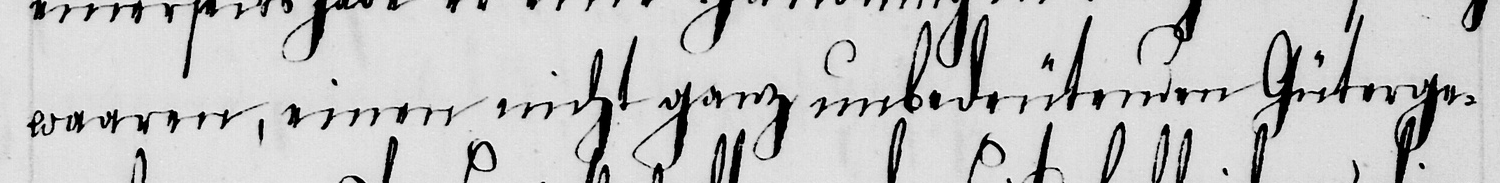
waaren, einen nicht ganz unbedeutenden Güterge¬
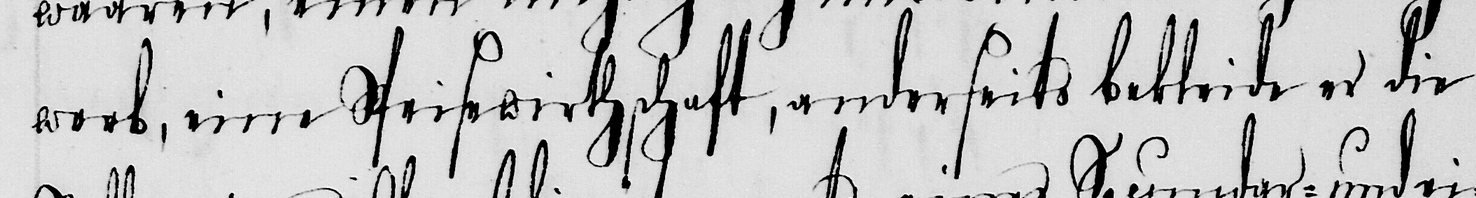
werb, eine Speisewirtschaft, anderseits bekleide er die
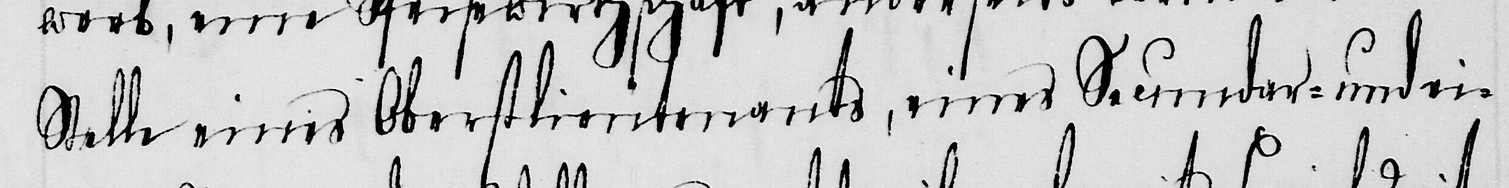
Stelle eines Oberstlieutenants, eines Secundar- und ei¬
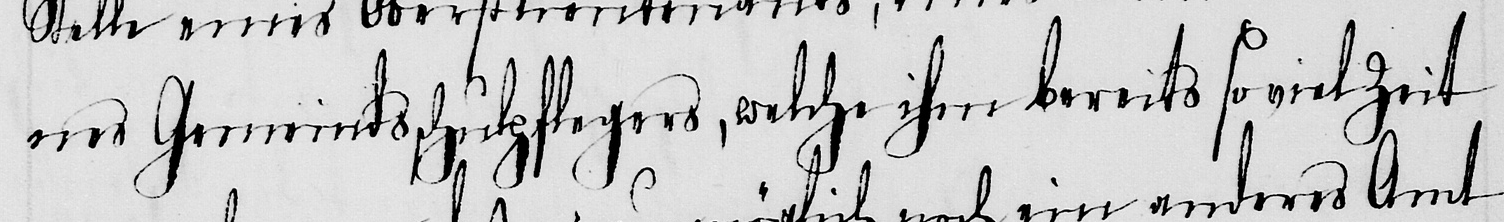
nes Gemeindsschulpflegers, welche ihm bereits so viel Zeit
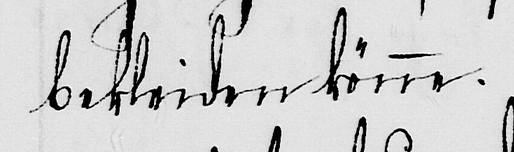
bekleiden könne.
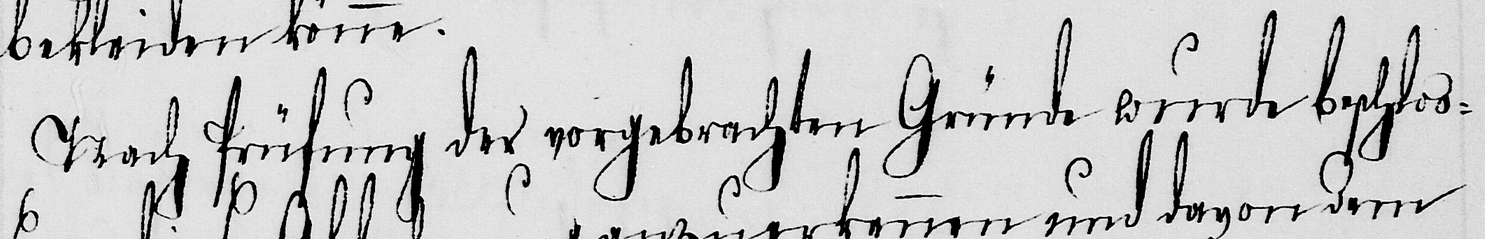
Nach Prüfung der vorgebrachten Gründe wurde beschlo¬
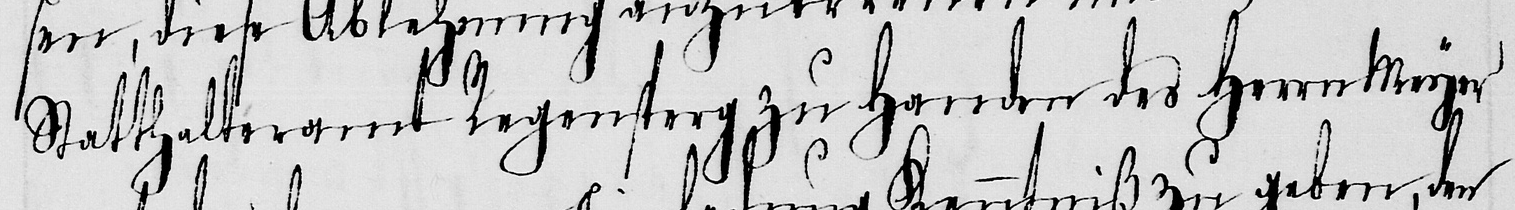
Statthalteramt Regensperg zu Handen des Herrn Meyer
